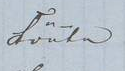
direct
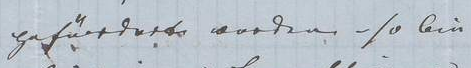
gefördert werden – so bin
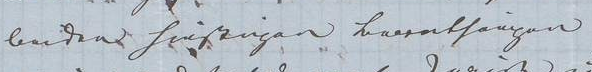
beiden hießigen Berathungen –
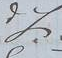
dem
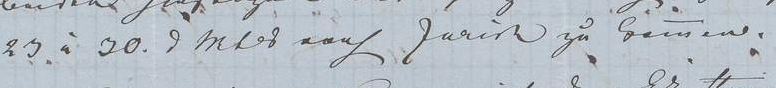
23 u 30. dMts nach Zürich zu kommen. –
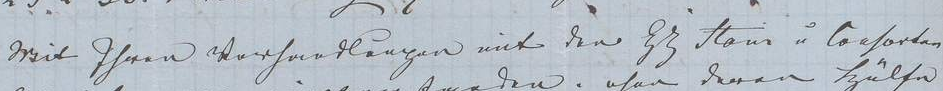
Mit Ihren Verhandlungen mit den Hohen Herrn Stamm u Consorten
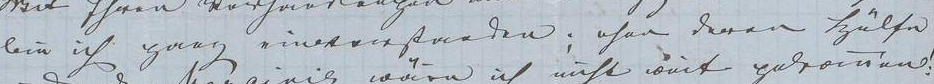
bin ich ganz einverstanden; ohne deren Hülfe
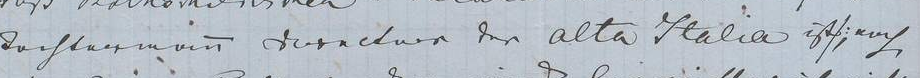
Tochtermann Director der alta Italia ist); noch
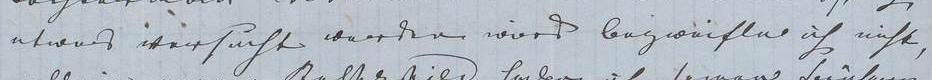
etwas versucht werden wird bezweifle ich nicht,
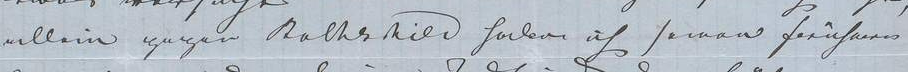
allein gegen Rothschild habe ich seinen frühern
